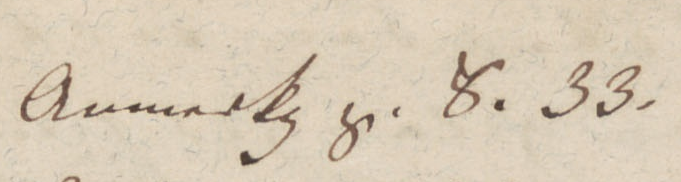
Anmerkg z. S. 33.
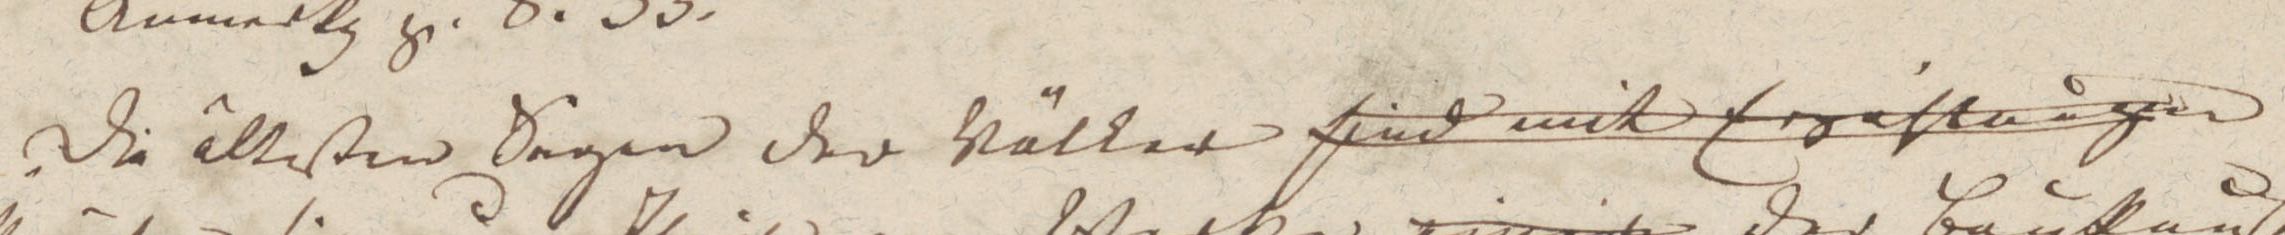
Die ältesten Sagen der Völker sind mit Erzählungen
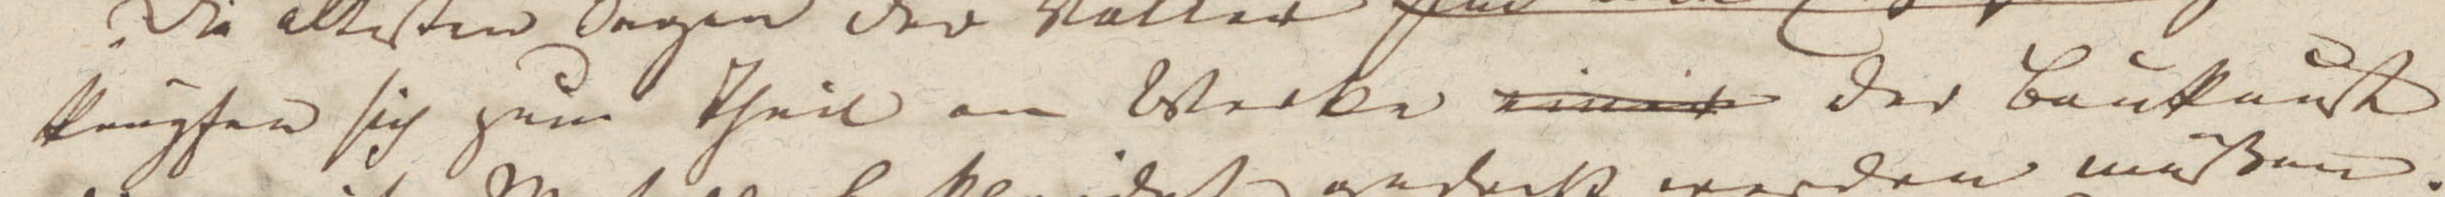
knüpfen sich zum Theil an Werke einer der Baukunst
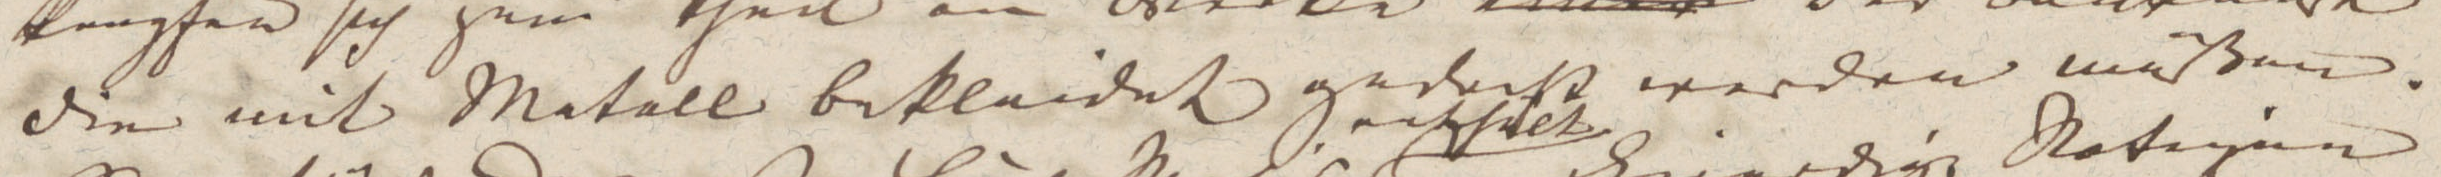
die mit Metall bekleidet gedacht werden müssen.
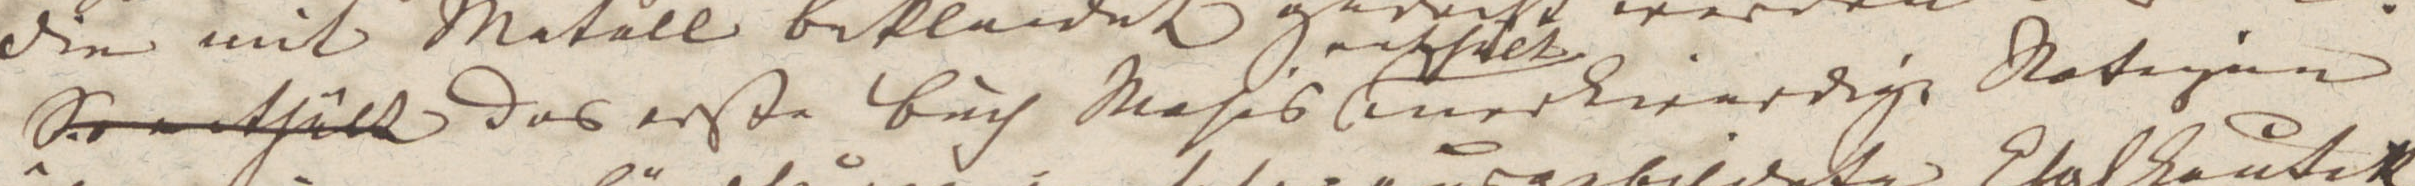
So enthält Das erste Buch Mosis enthält merkwürdige Notizen
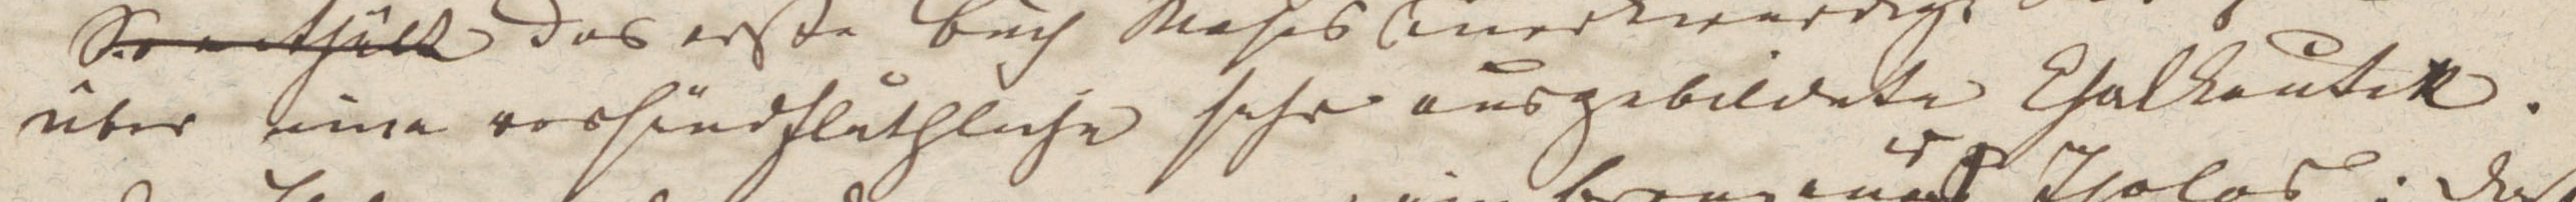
über eine vorsündflutliche sehr ausgebildete Chalkeutik.
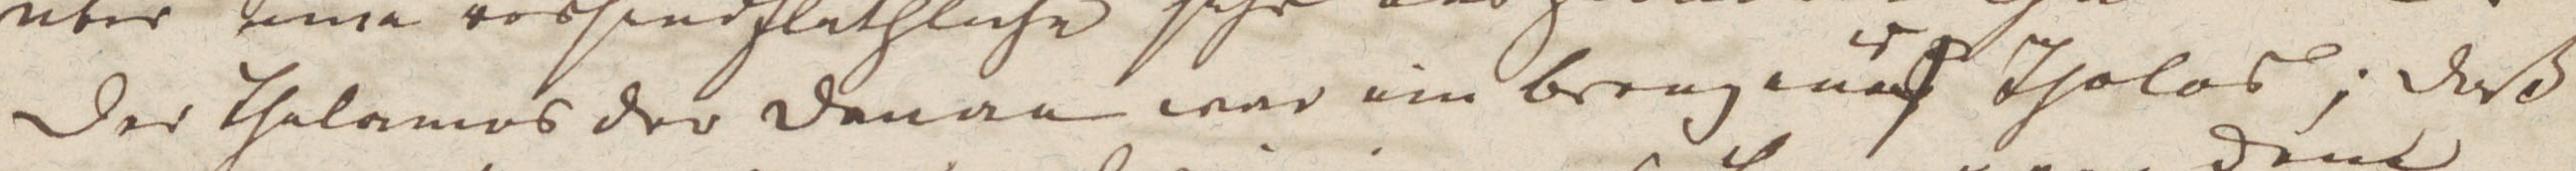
Der Thalamos der Danae war ein bronzener Tholos; Dass
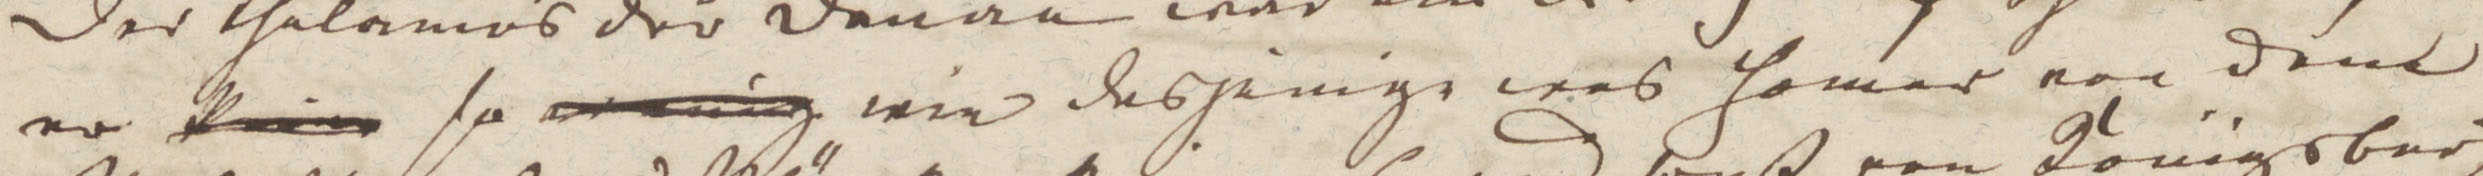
er kein so wenig wie dasjenige was Homer von denm
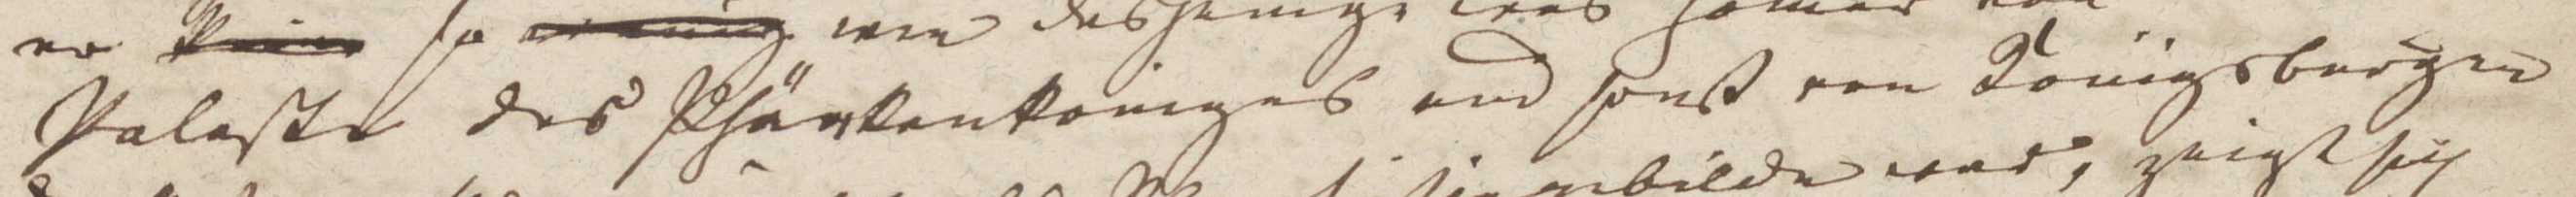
Palaste des Phäakenkoniges und sonst von Königsburgen
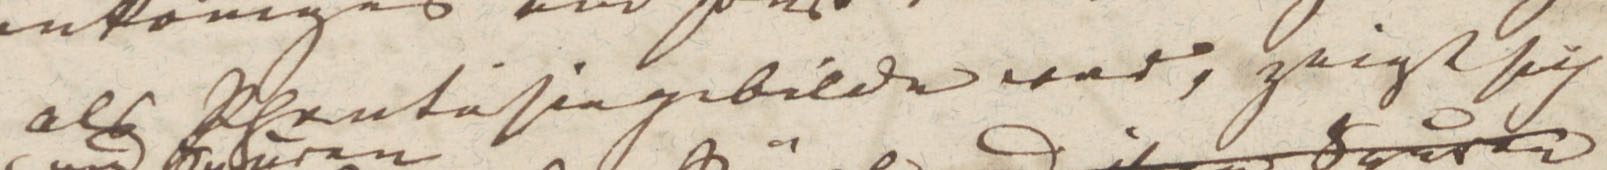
als Phantasiegebilde war, zeigt sich
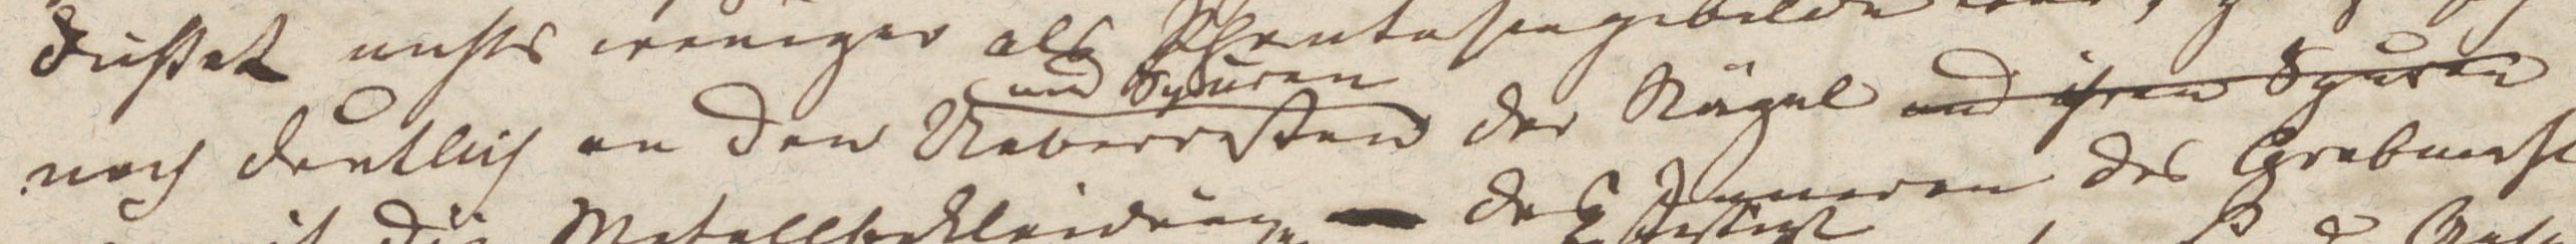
noch deutlich an den Ueberresten und Spuren der Nägel und ihren Spuren
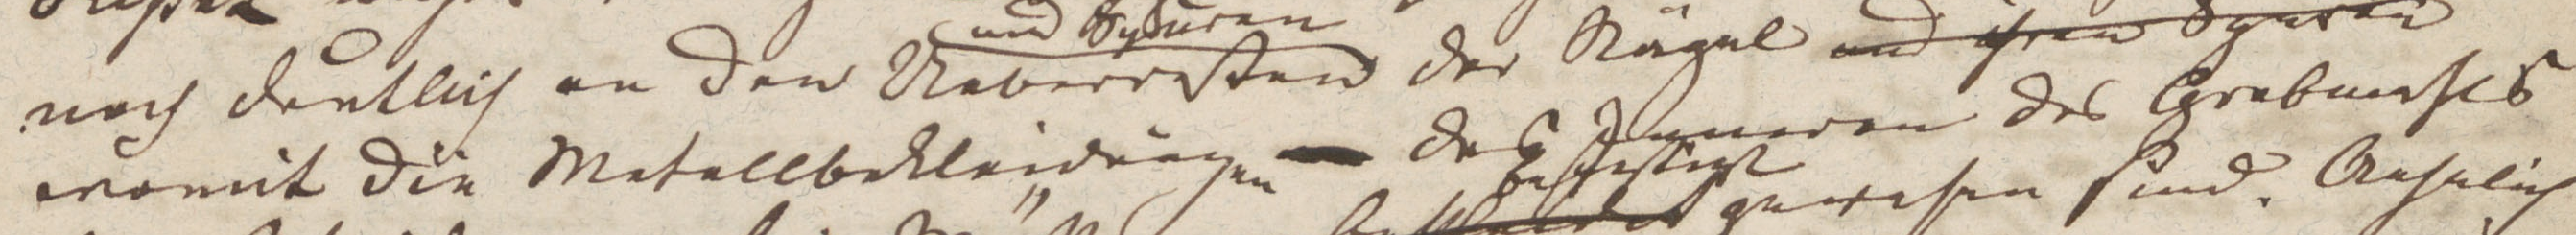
womit die Metallbekleidungen des Inneren des Grabmahls
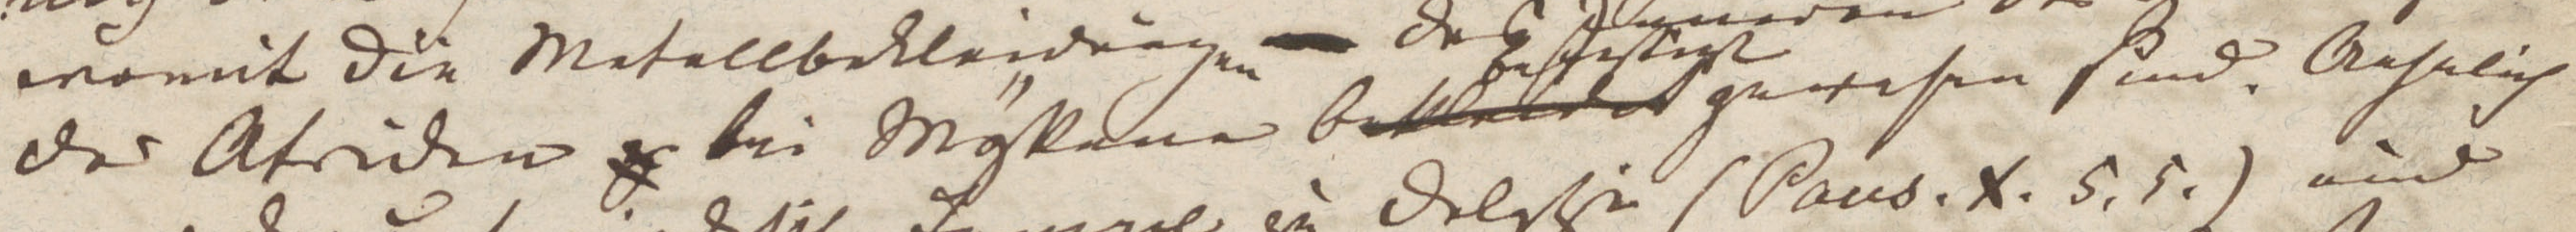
der Atriden bei Mykene bekleidet befestigt gewesen sind. Aehnlich
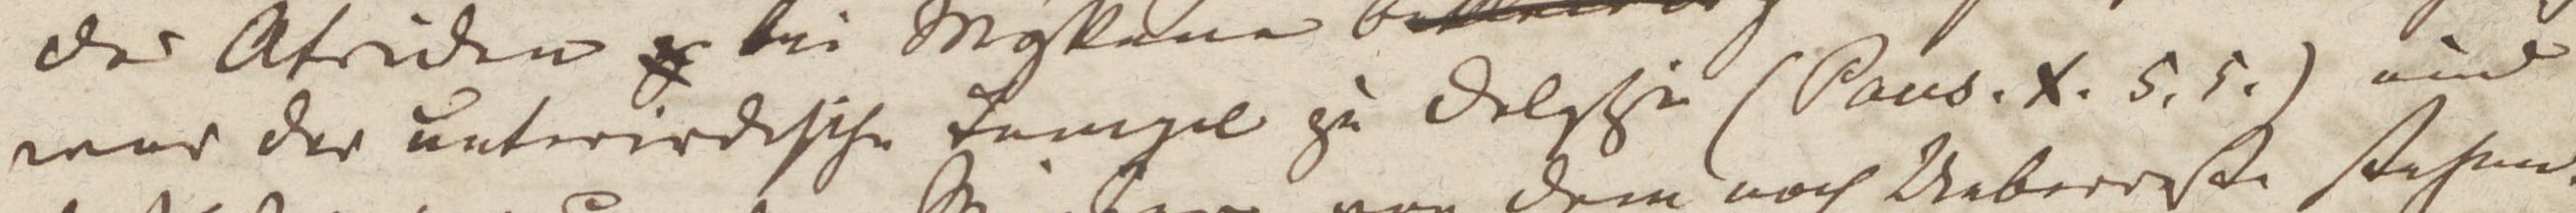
war der unterirdische Tempel zu Delphi (Paus. X. 5. 5.) und
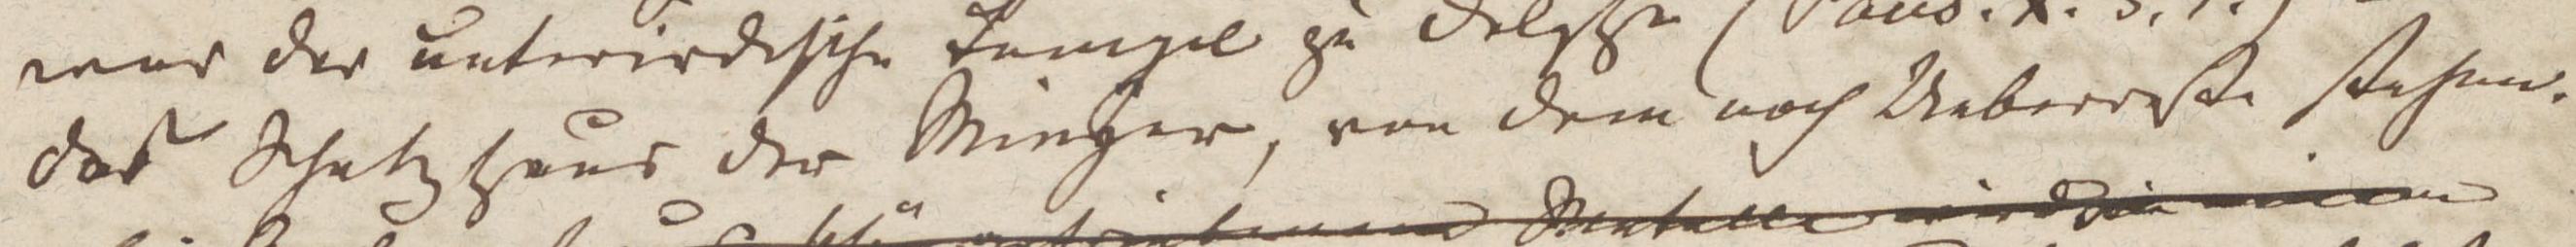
das Schatzhaus der Minyer, von dem noch Ueberreste stehen.
